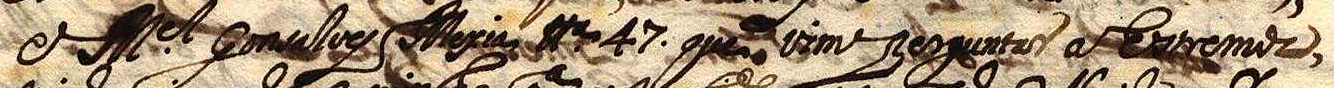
e M.el Goncalves Mexia tt.a 47. que vim perguntar a Estremoz,
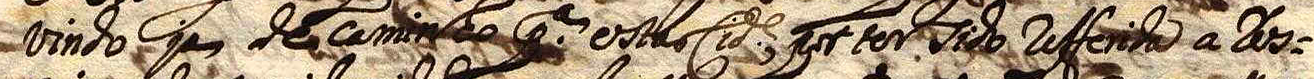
vindo ja de caminho p.a esta Cid.e; por ter sido Refferida a Res
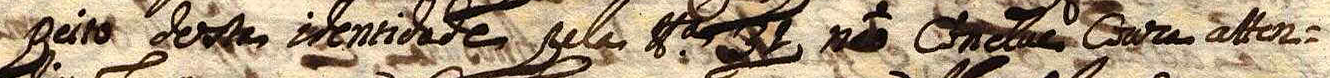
peito desta identidade pela tt.a 31 naõ Conclue Couza atten
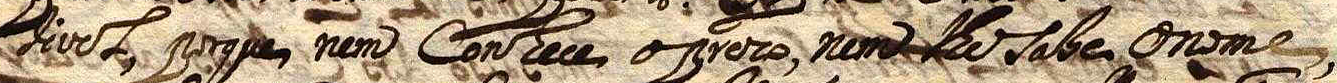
diveL, porque nem conhece o prezo, nem lhe sabe o nome,
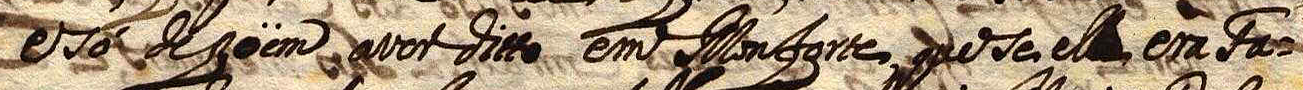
e só depoem aver ditto em Monforte que se elle era Fa
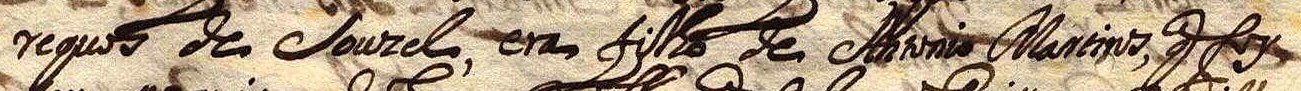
requos de Souzel, era filho de Antonio Martins, q̄ foy
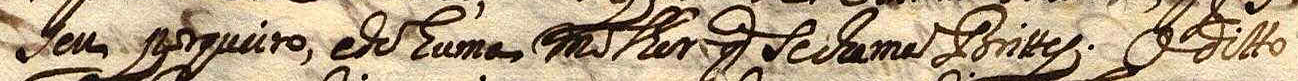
seu porqueiro, e de huma molher q̄ se chama Brittes. O ditto
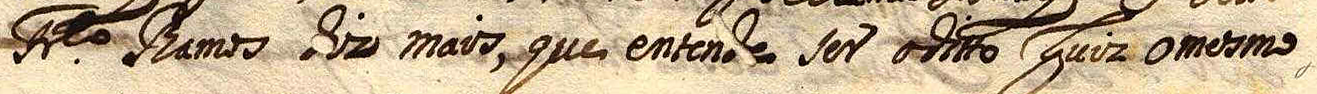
Fr.co Ramos diz mais, que entende ser o ditto Luiz o mesmo
